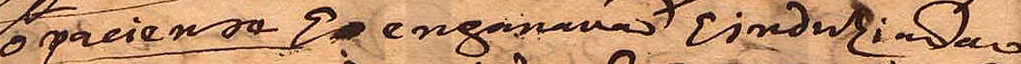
o paciente E o enganauão E induziaõ ao
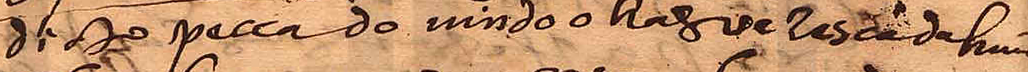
dicto peccado uindo o has vezes cada hūu
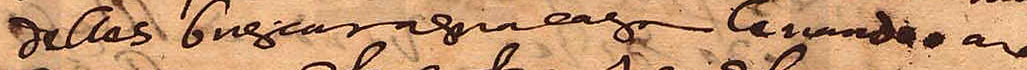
delles buscar a sua casa leuandoo ao
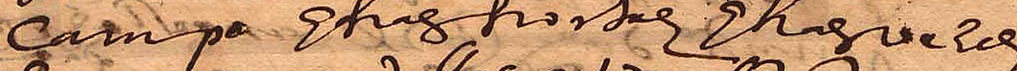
Campo E has hortas E has vezes
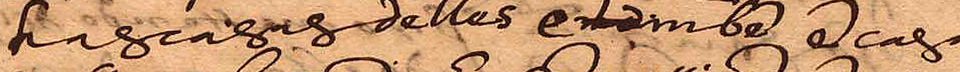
has casas delles e tambē ē casa
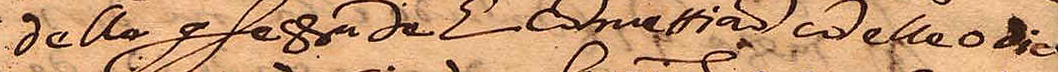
delle ꝯfessāte E cōmettião cō elle o dic
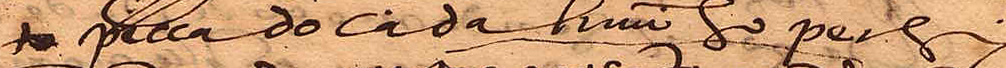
to peccado cada hūu so per sy
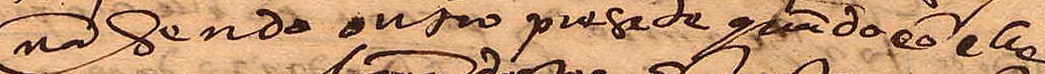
nā sendo outro presēte quādo cō elle
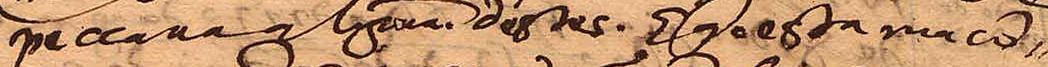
peccaua algūu destes. E q̄ o esta ma cō
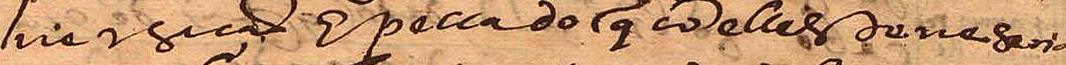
uersação E peccado q̄ cō elles teue seria
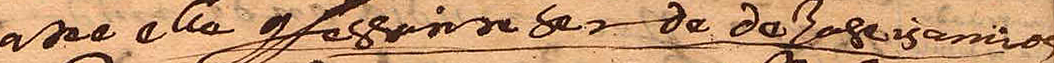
atee elle ꝯfessante ser de dezaseis annos
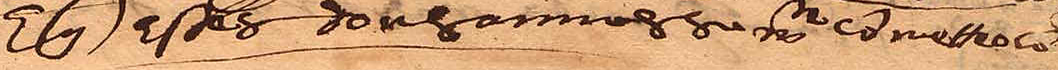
E q̄ estes dous annos somte cōmetteo cō
